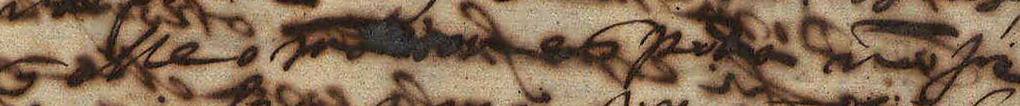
q̄ elle o mādou esperar nā Jr
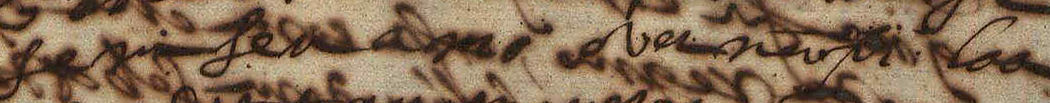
sem seu amo o ver nā foi laa
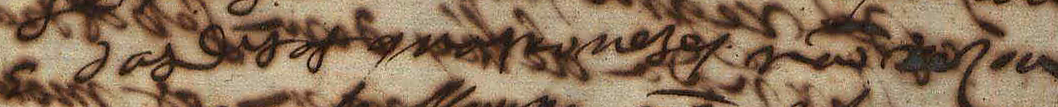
e das ditas quatro uezes não rezou
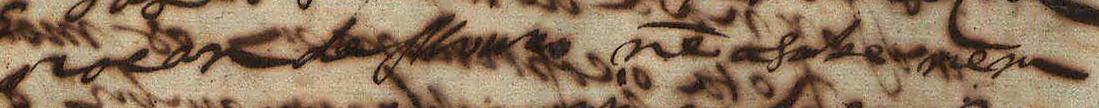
oraçam de Mouro nē a sabe nem
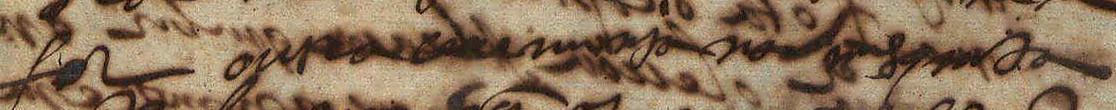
fez outra ceremonja na mesquita
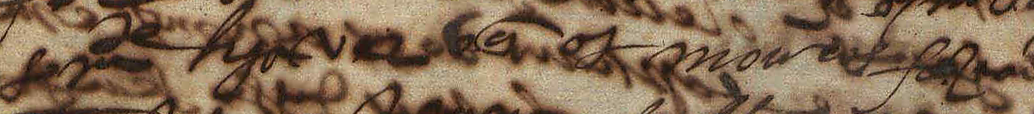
somte hya uer o q̄ os mouros faziāo
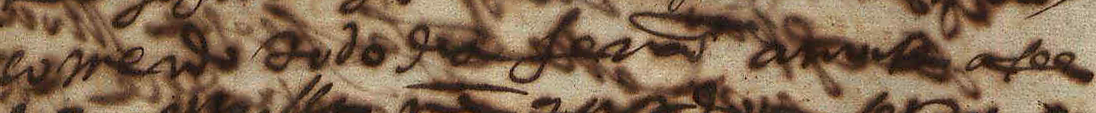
comendo todo dia senão a noite atee
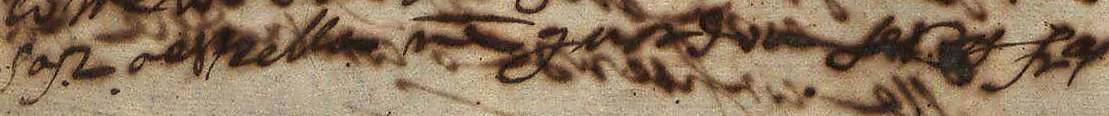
sajr a estrella nē guardou sestas fras.
